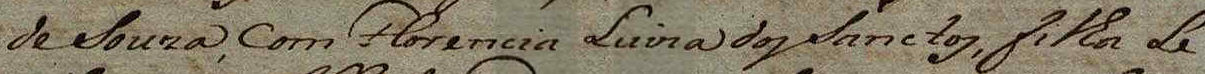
de Sousa, com Florencia Luiza dos Sanctos, filha Le
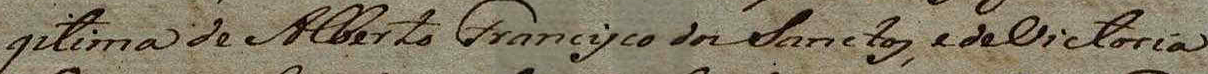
gitima de Alberto Francisco dos Sanctos, e de Victoria
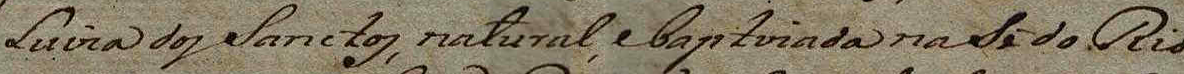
Luiza dos Sanctos, natural e baptizada na Sé do Rio
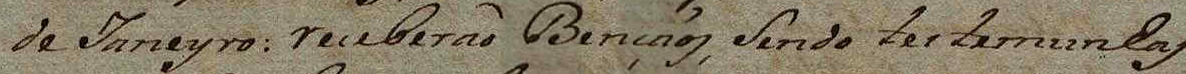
de Ianeiro: receberaõ Bençaõs, sendo testemunhas
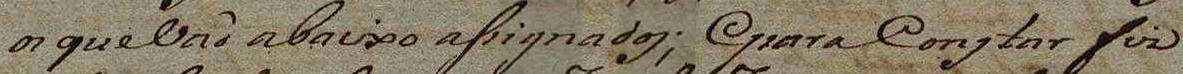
os que Vaõ abaixo assignados; E para Constar foi
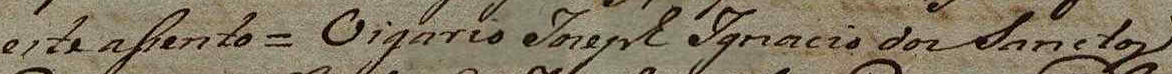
este assento= Vigario Iozeph Ignacio dos Sanctos
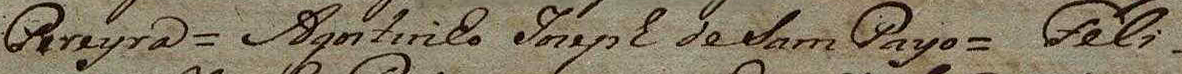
Pereyra= Agostinho Iozeph de Sam Payo= Feli
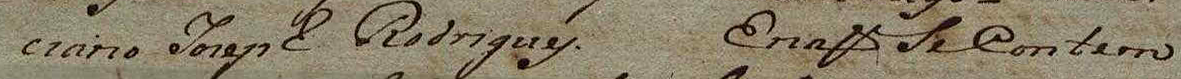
ciano Iozeph Rodrigues. E naõ Se contem
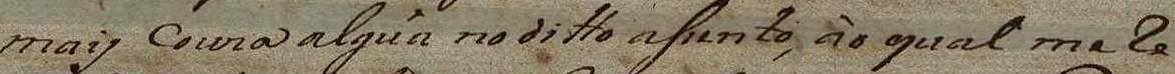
mais couza alguā no ditto assento, ao qual me Re
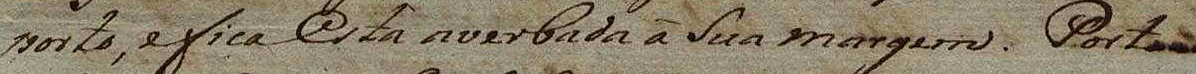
porto, e fica Esta averbada à sua margem. Porto
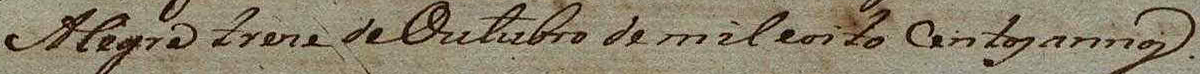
Alegre treze de Outubro de mil e oitocentos annos
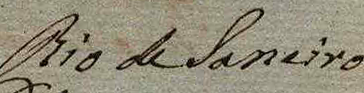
Rio de Ianeiro
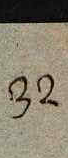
32
